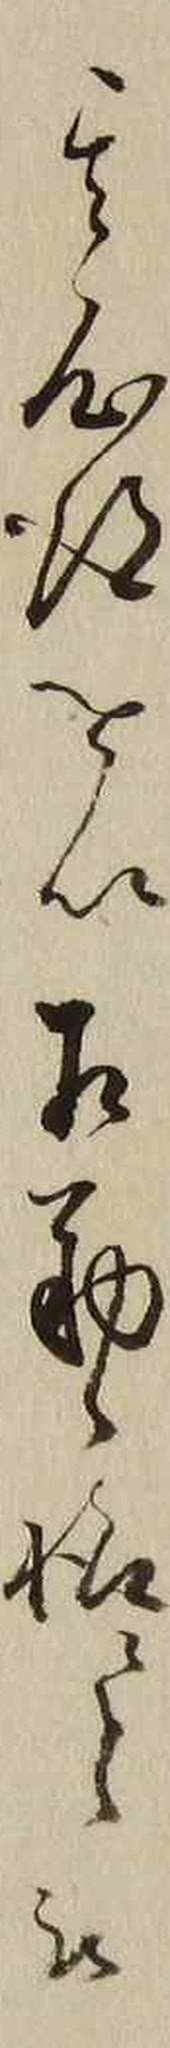其心得を以相勤候様ニと被
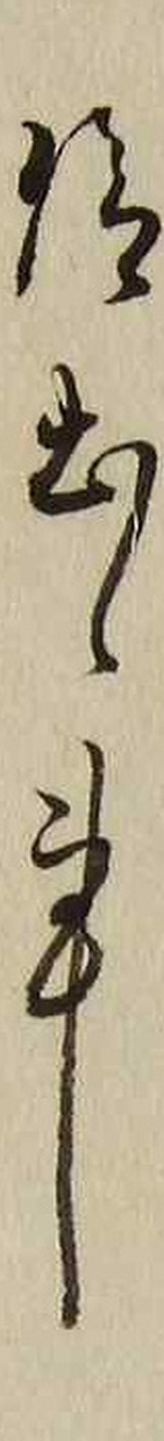仰出候事
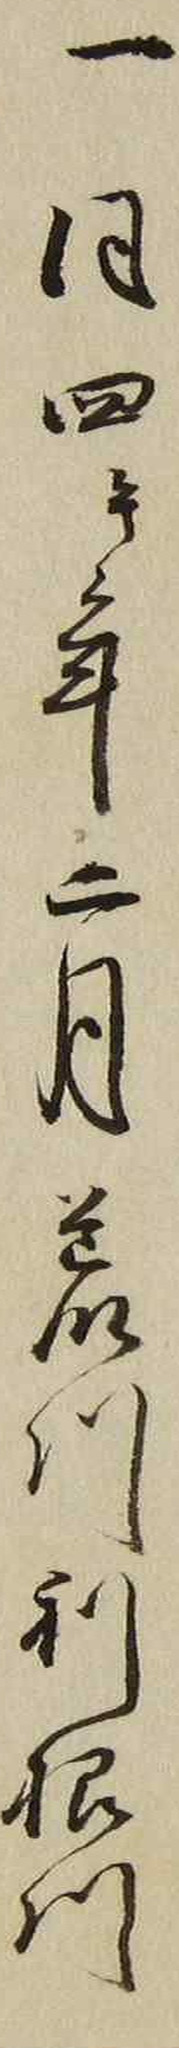一同四午年二月荒川利根川
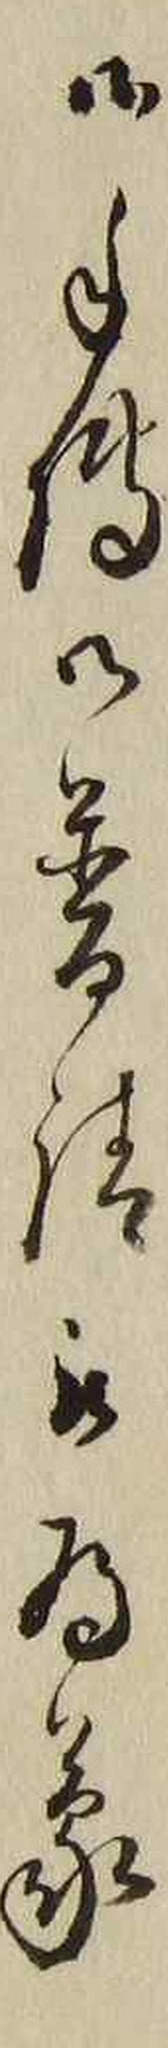御手伝御普請被為蒙
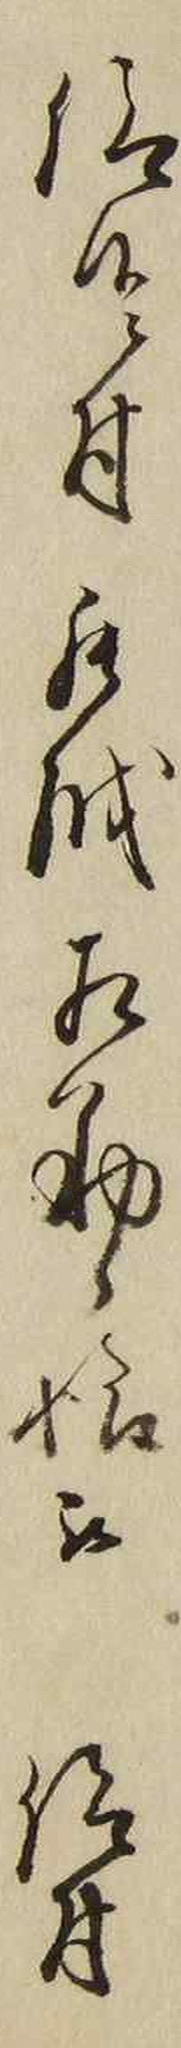仰候ニ付罷越相勤候様被仰付

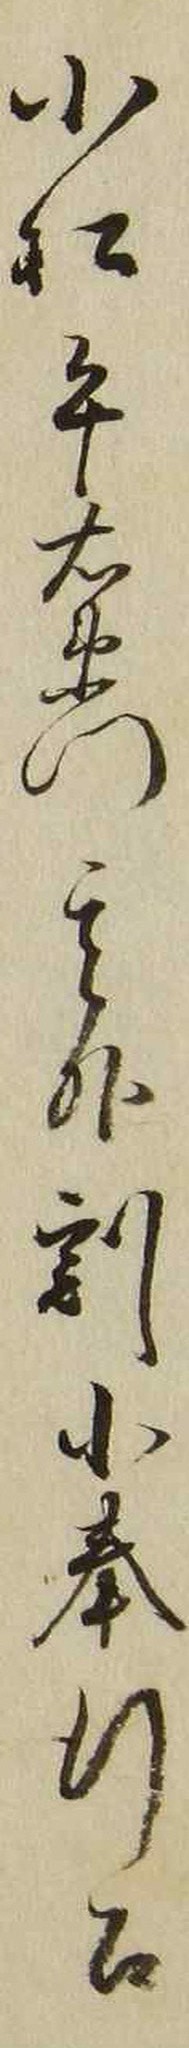小松平右衛門其外割小奉行召
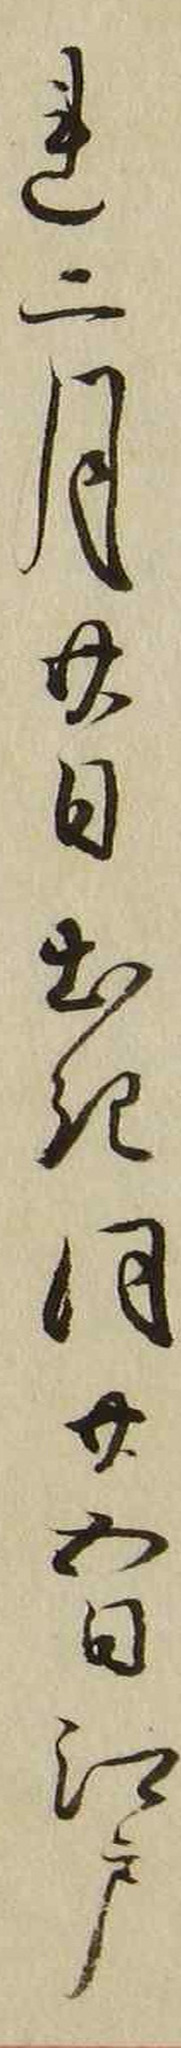れ二月廿日出起同廿五日江戸
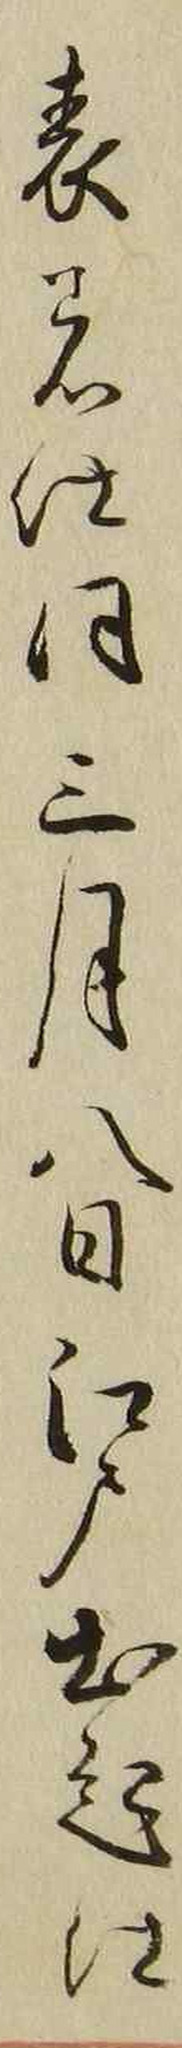表着仕同三月八日江戸出起仕
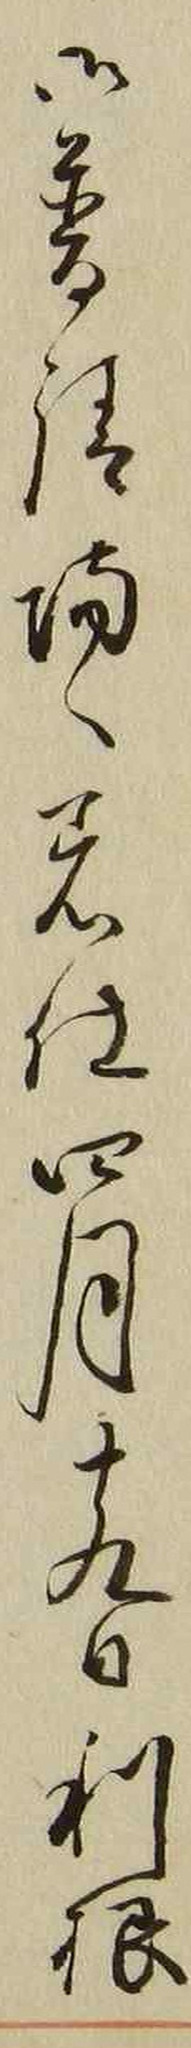御普請場へ着仕四月十九日利根
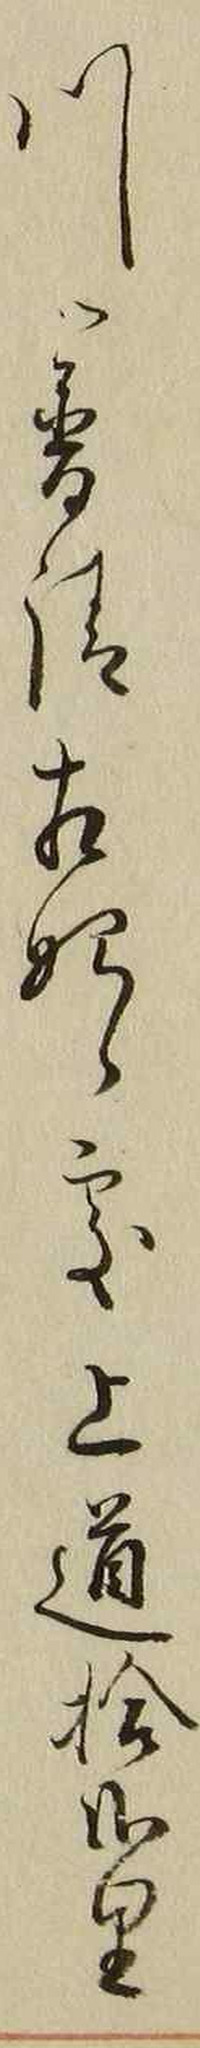川へ普請相始候処上道拾弐里
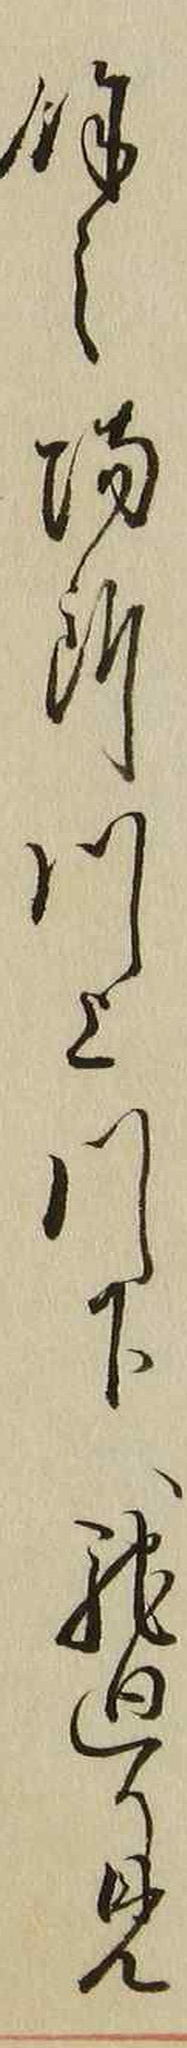余之所川上川下馳廻り見
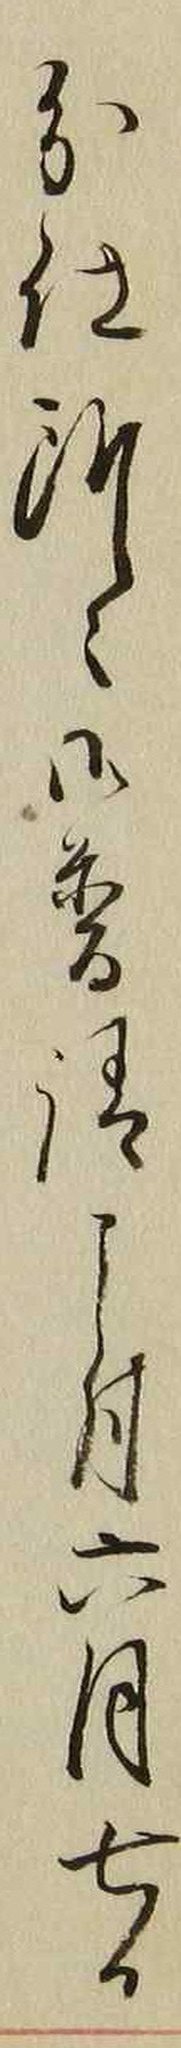分仕所々御普請申付六月七日
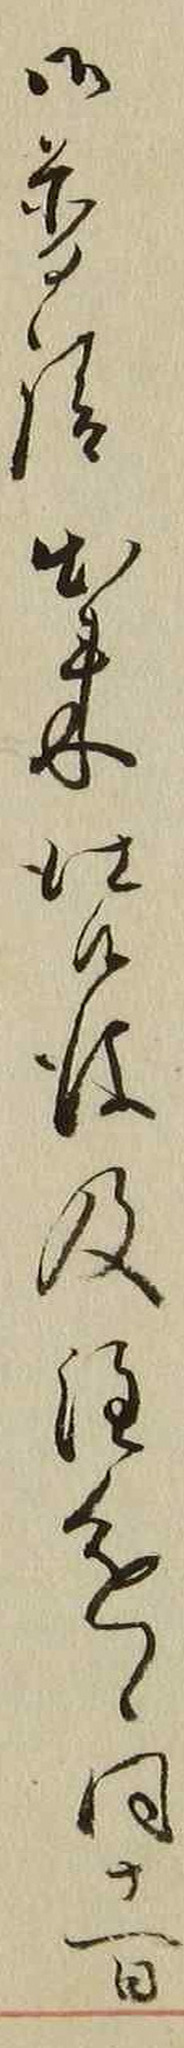御普請出来仕候儀及注進候同十一日
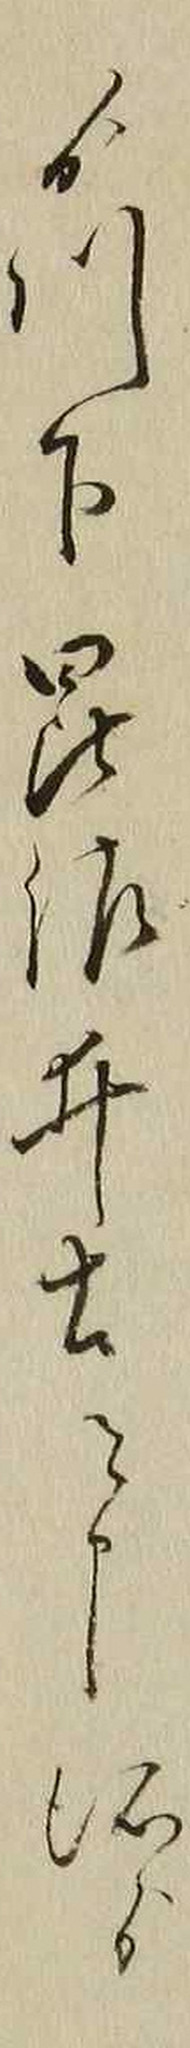ゟ川下昆佐井土と申所ゟ
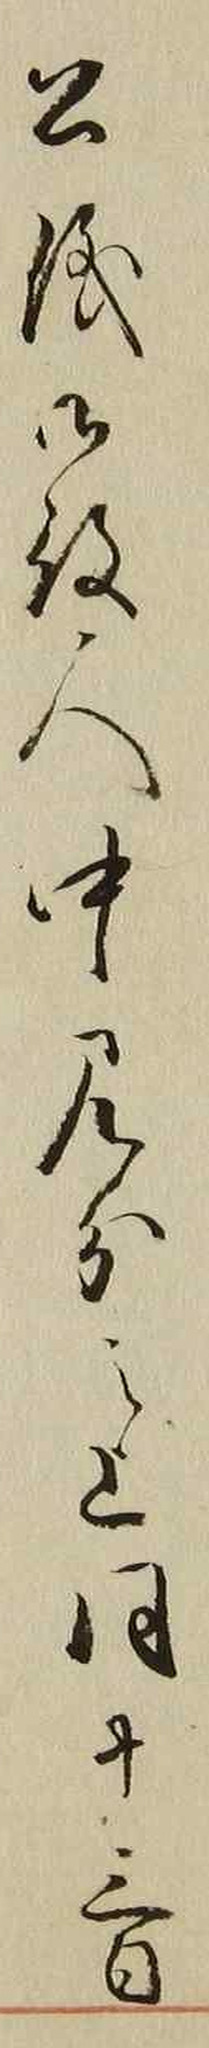公儀御役人中見分之上同十三日
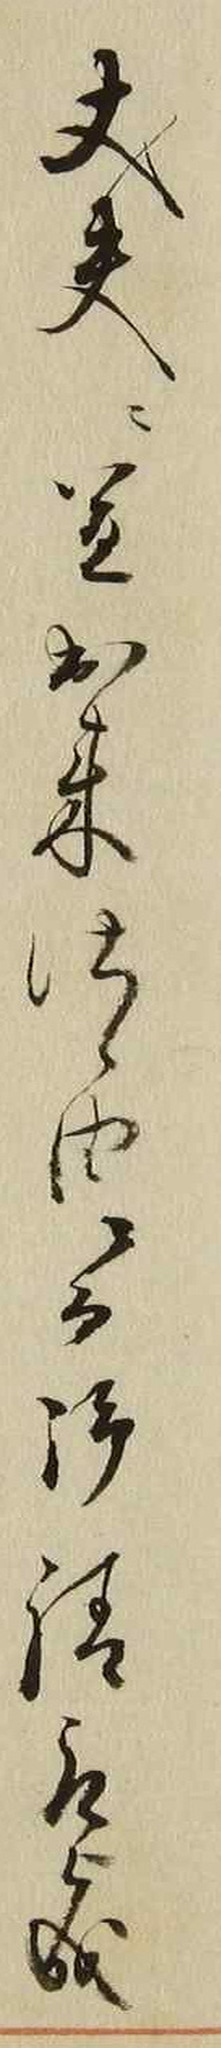丈夫ニ宜出来仕候由ニ而御請取被成
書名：諸士系譜　巻之1　い之部1
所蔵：会津若松市立会津図書館
